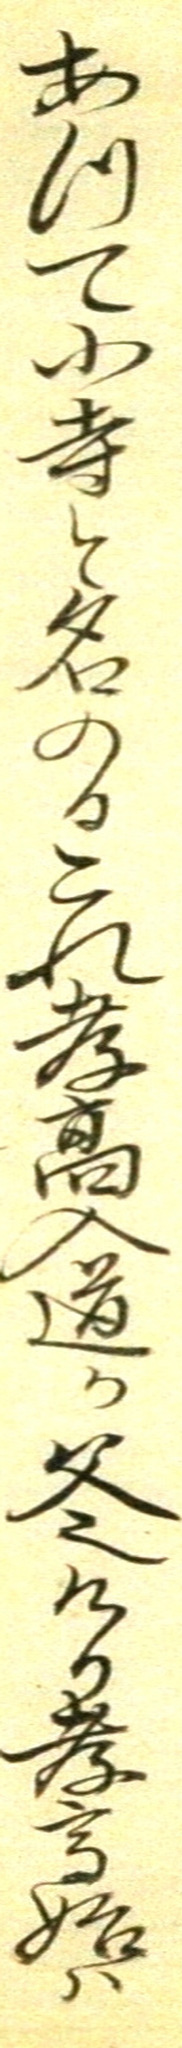あつて小寺と名のるこれ孝高入道か父也けり孝高始は
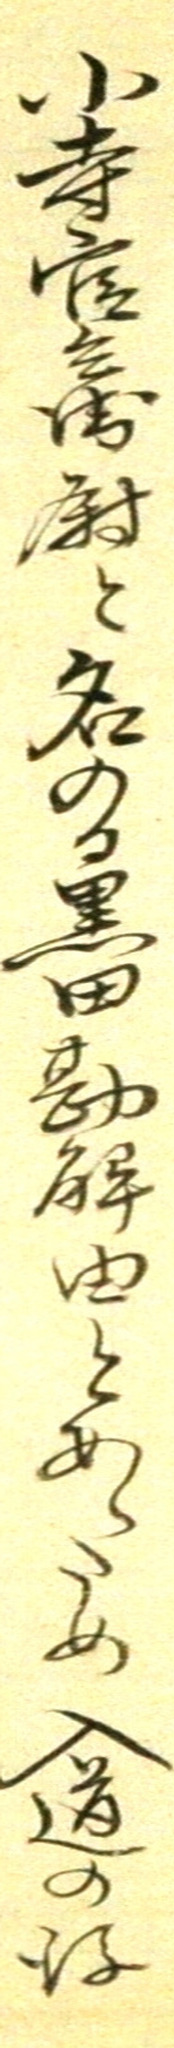小寺官兵衛と名のる黒田勘解由とあらため入道の後
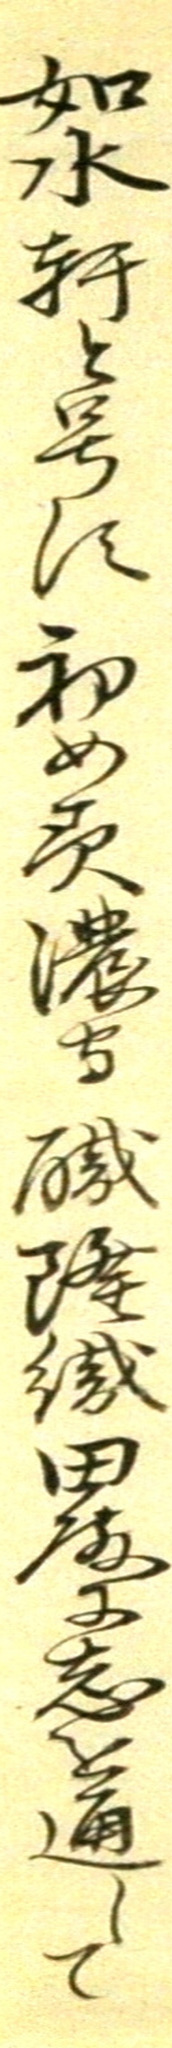如水軒と号す初め美濃守職隆織田殿に志を通して
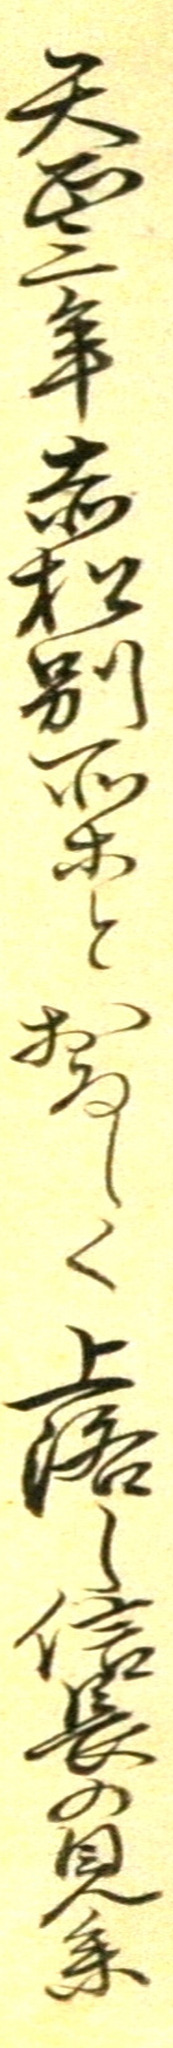天正三年赤松別所等とおなしく上洛し信長の見参

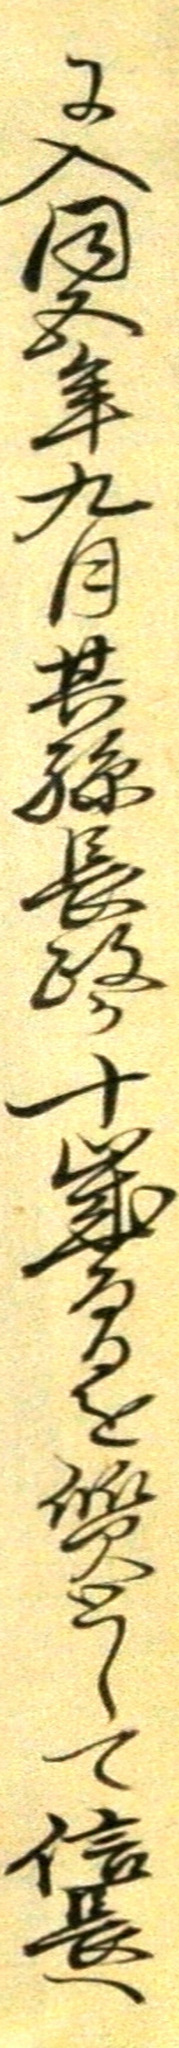に入同五年九月其孫長政か十歳なるを質として信長へ
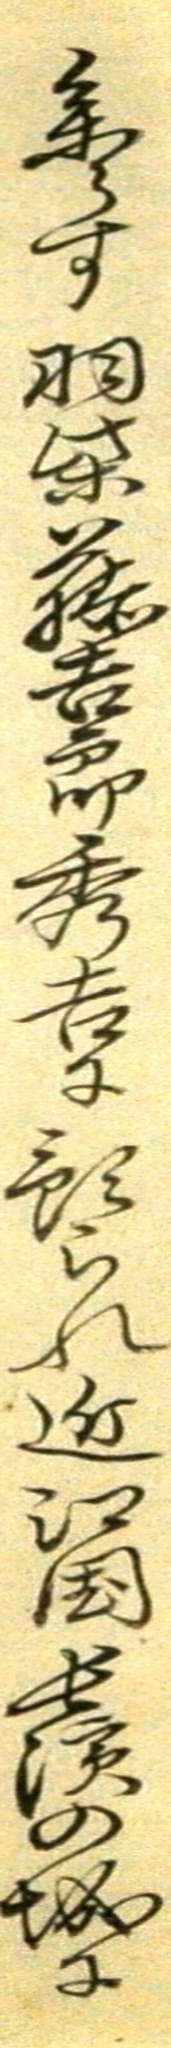参らす羽柴藤吉郎秀吉に預られ近江国長浜の城に
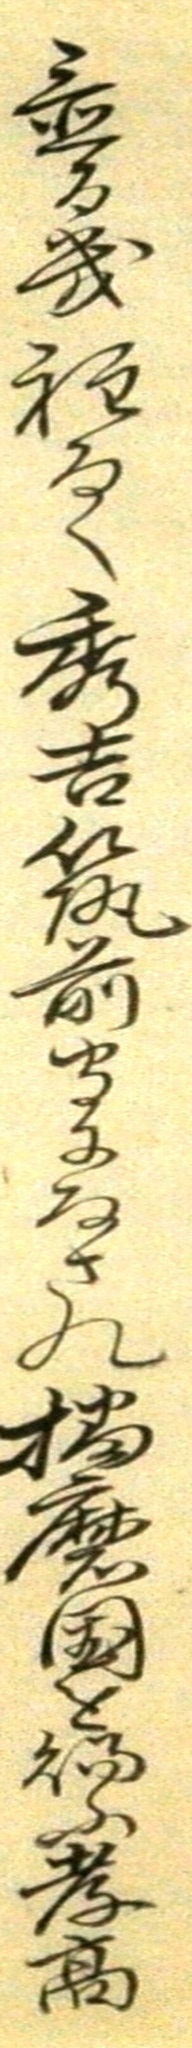置る幾程なく秀吉筑前守になされ播磨国を賜ふ孝高
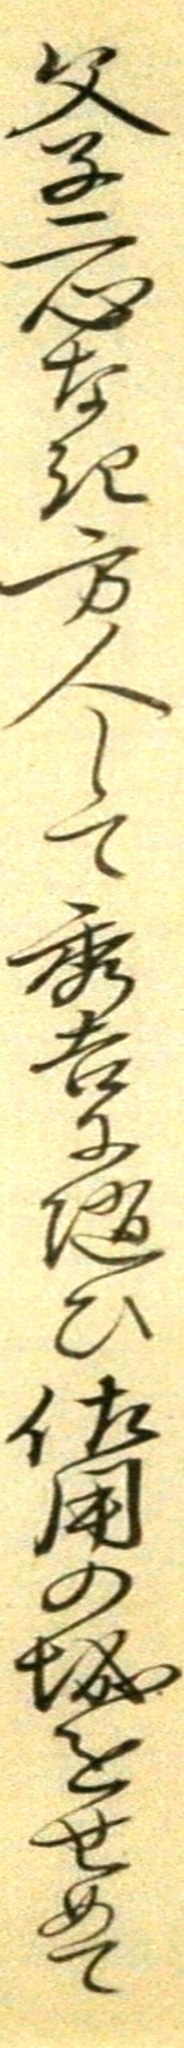父子二心なき方人して秀吉に随ひ佐用の城をせめて
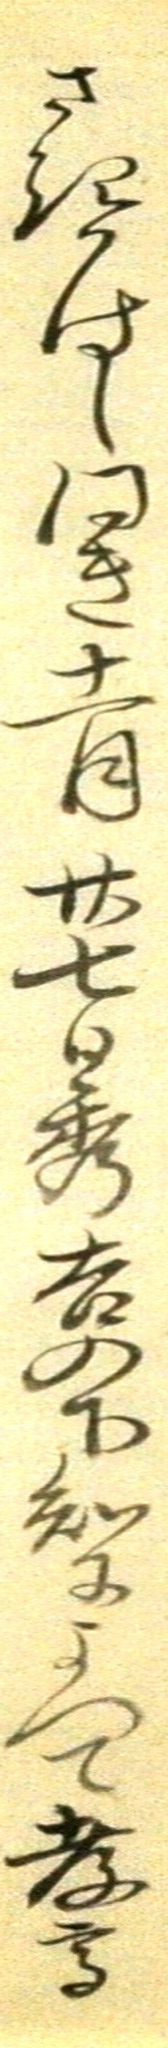さきかけし同き十一月廿七日秀吉の下知によつて孝高
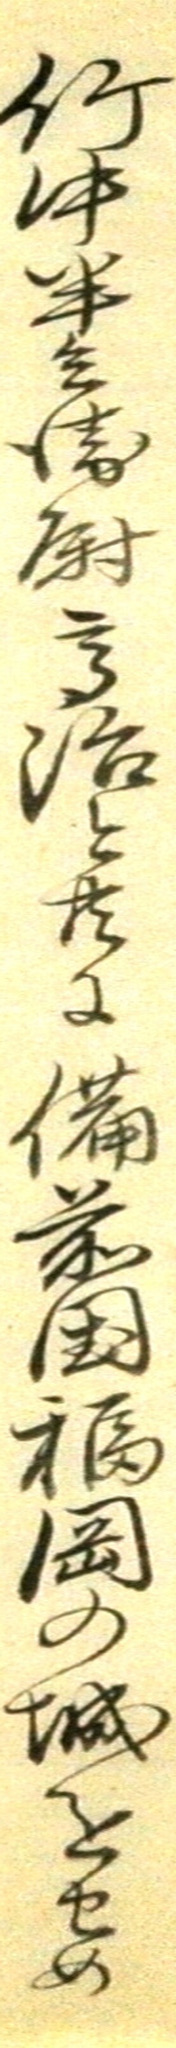竹中半兵衛尉高治と共に備前国福岡の城をせめ
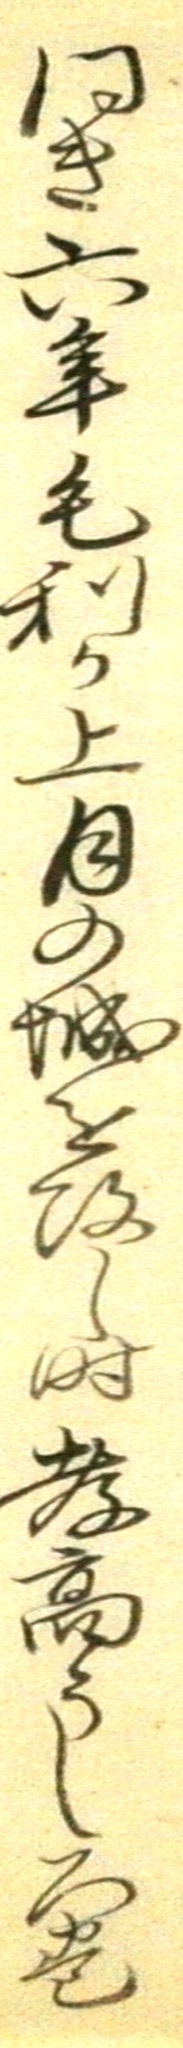同き六年毛利か上月の城を攻し時孝高うしろ巻
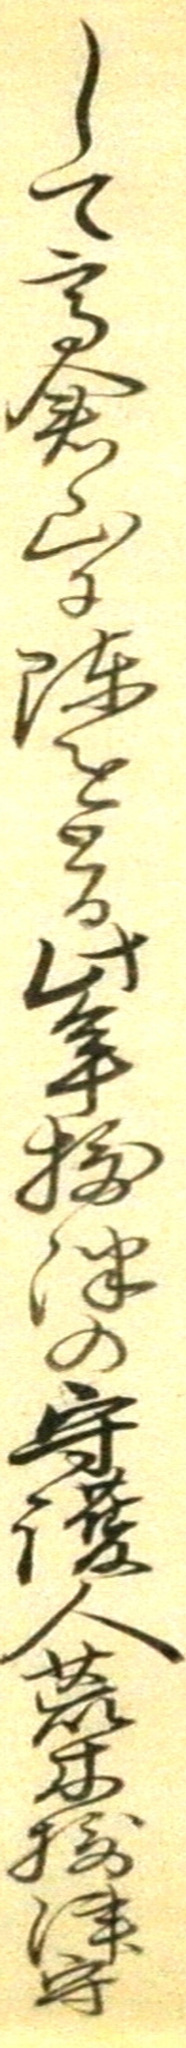して高倉山に陣をとる此年摂津の守護人荒木摂津守
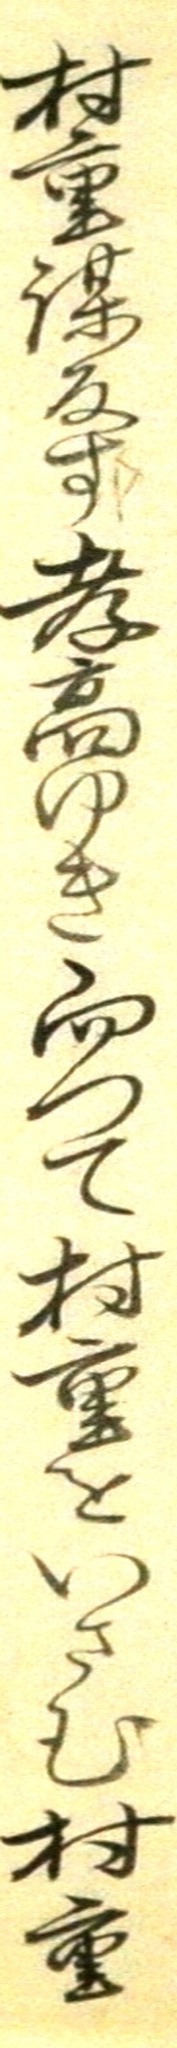村重謀反す孝高ゆき向つて村重をいさむ村重
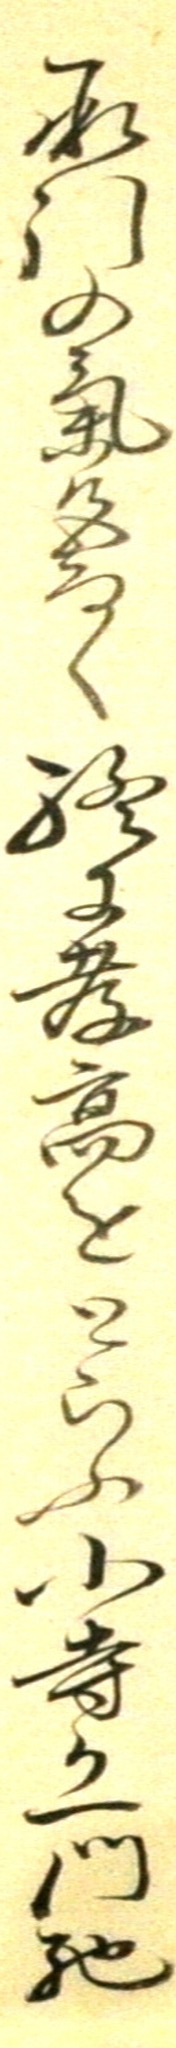承引の気色なく終に孝高をとらふ小寺か一門馳
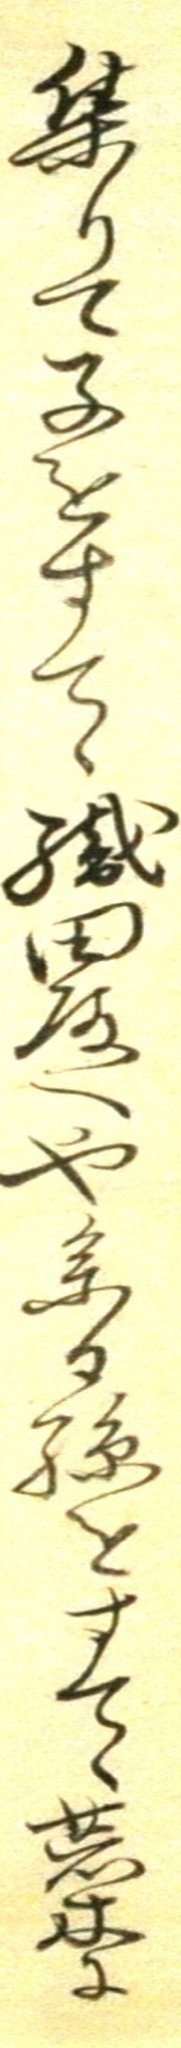集りて子をすてゝ織田殿へや参る孫をすてゝ荒木に
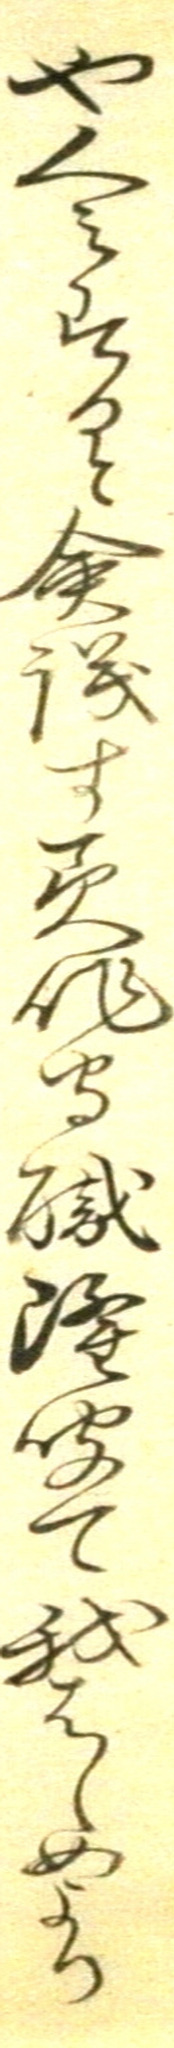やくみすると僉議す美作守職隆聞て我はしめより
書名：藩翰譜（七・上）
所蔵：伊那市立高遠町図書館・合同会社AMANE
